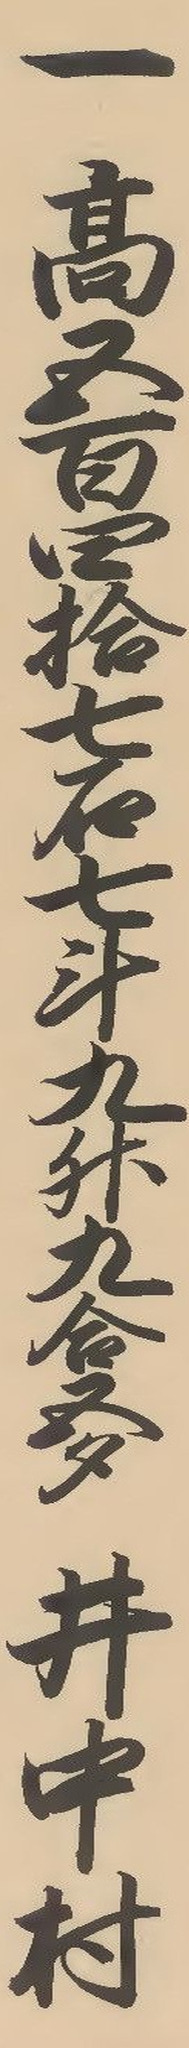一高五百四拾七石七斗九升九合五勺井中村
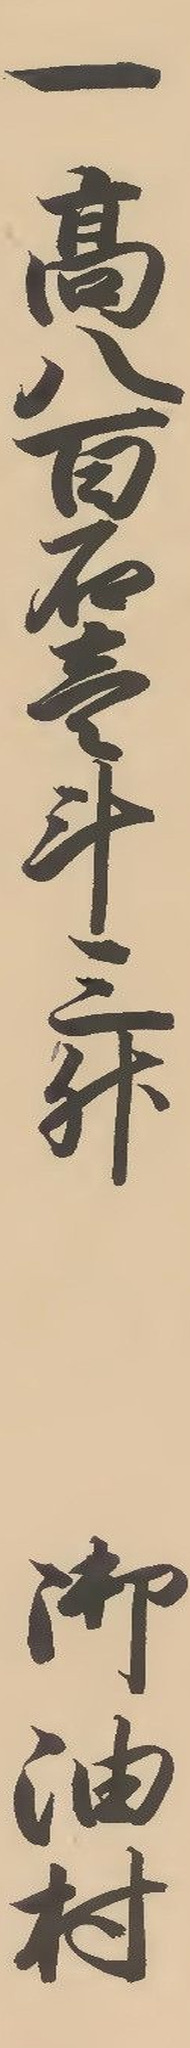一高八百石壱斗三升御油村
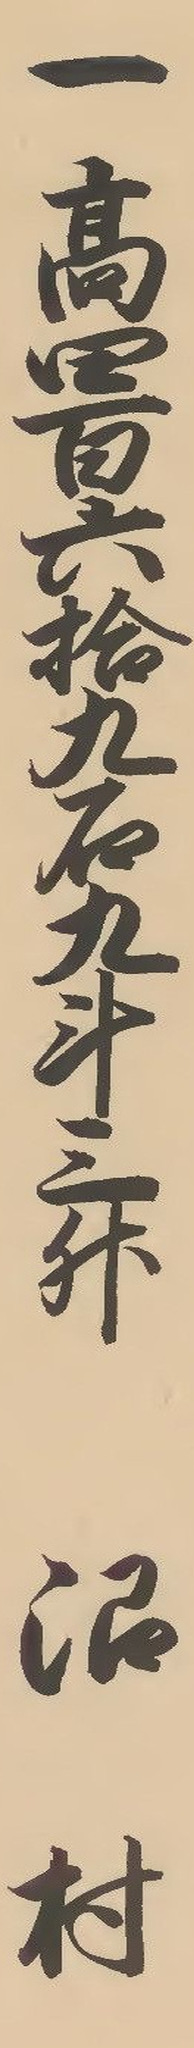一高四百六拾九石九斗三升沼村

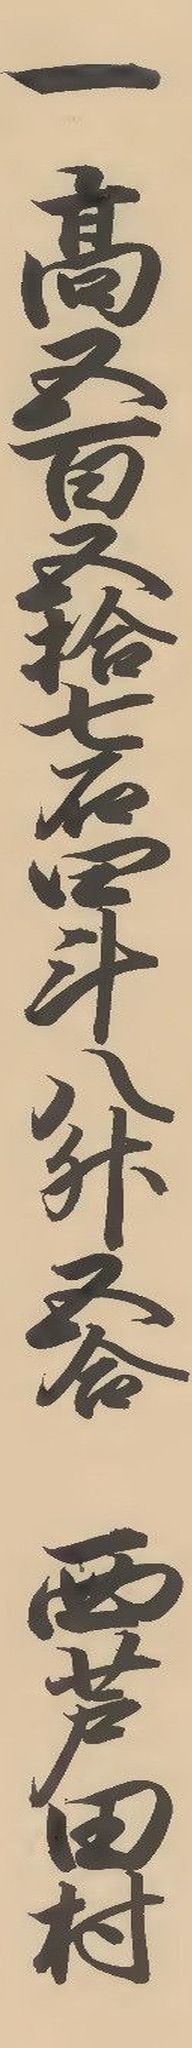一高五百五拾七石四斗八升五合西芦田村
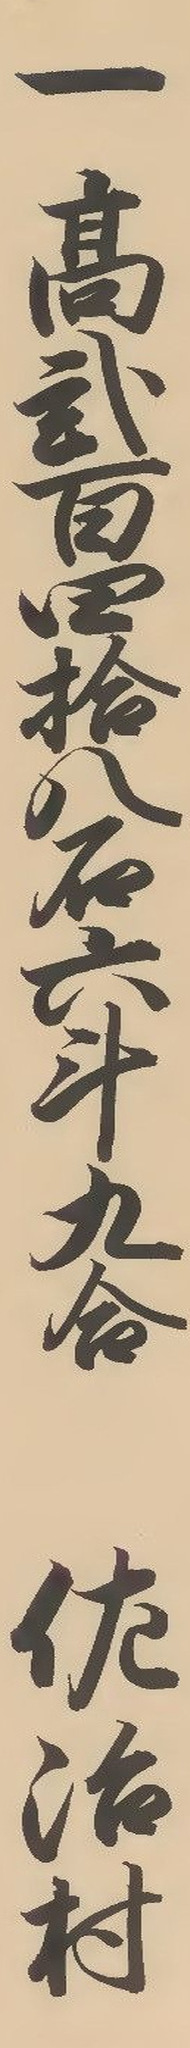一高弐百四拾八石六斗九合佐治村
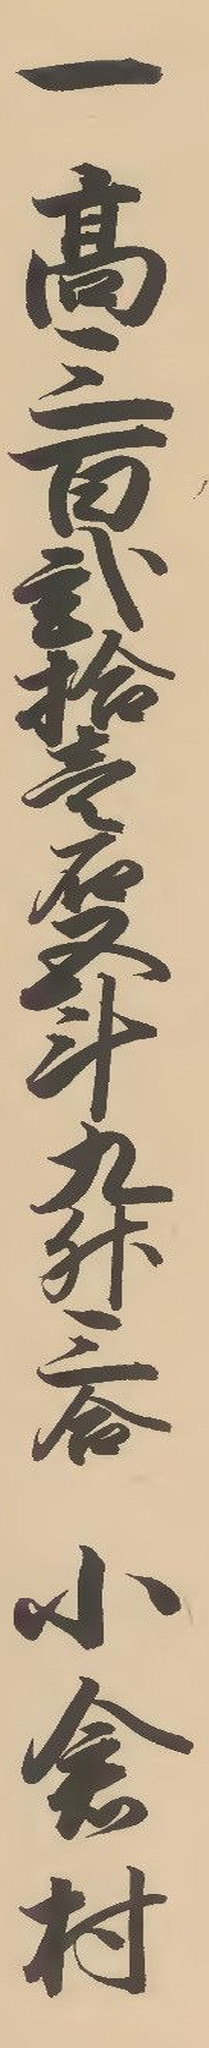一高三百弐拾壱石五斗九升三合小倉村
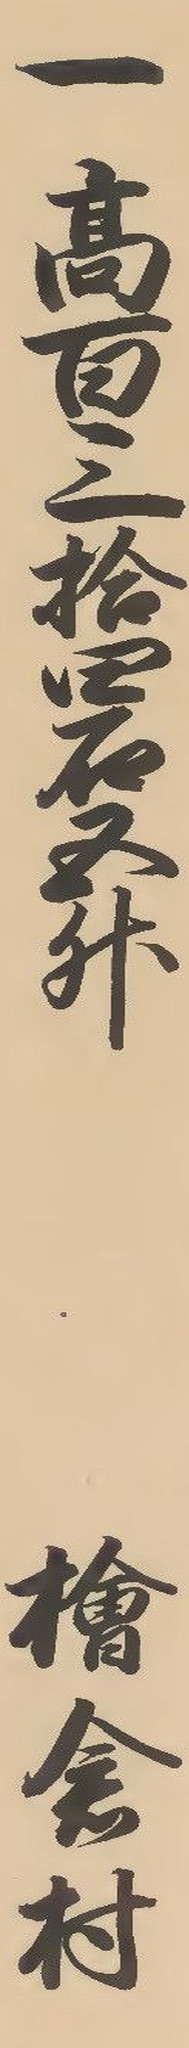一高百三拾四石五升桧倉村
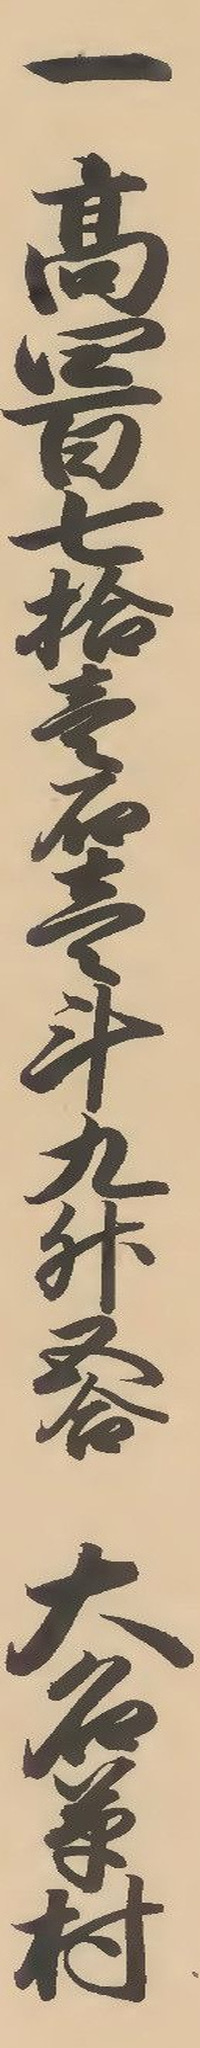一高四百七拾壱石壱斗九升五合大名草村
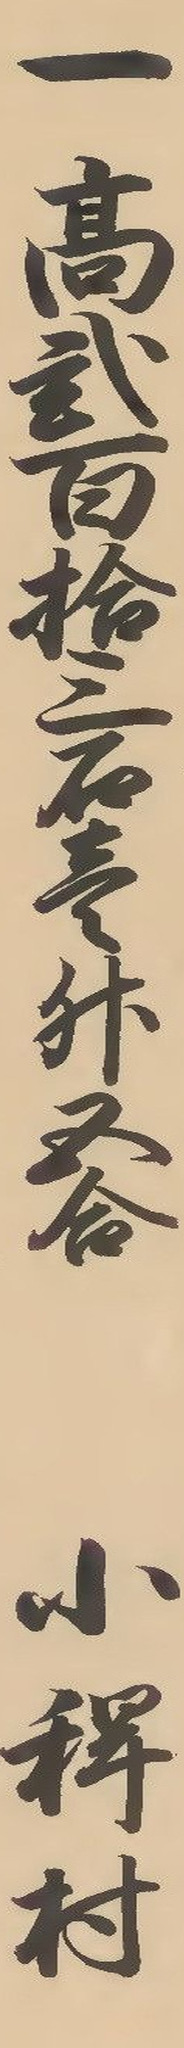一高弐百拾三石壱升五合小稗村

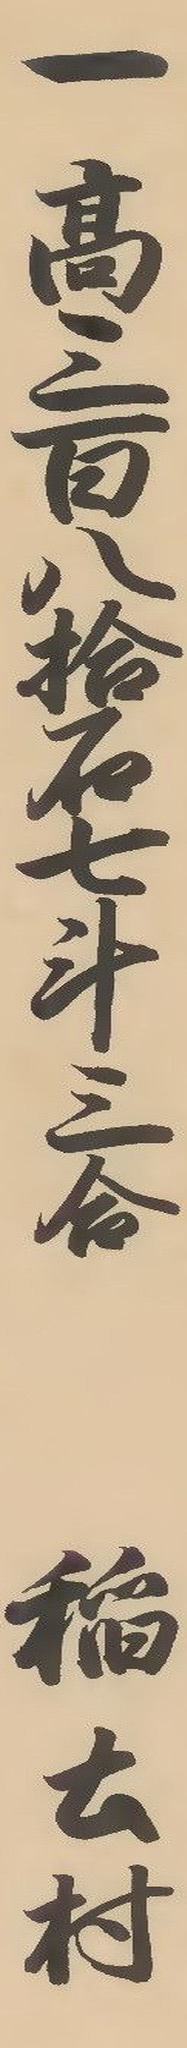一高三百八拾石七斗三合稲土村
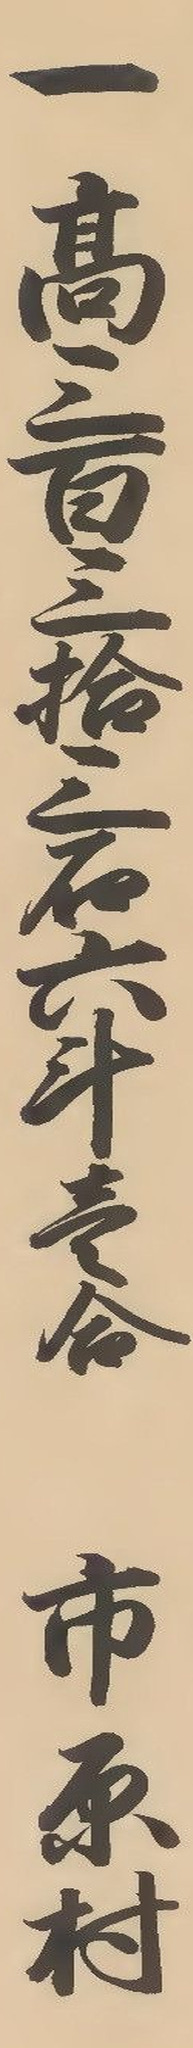一高三百三拾三石六斗壱合市原村
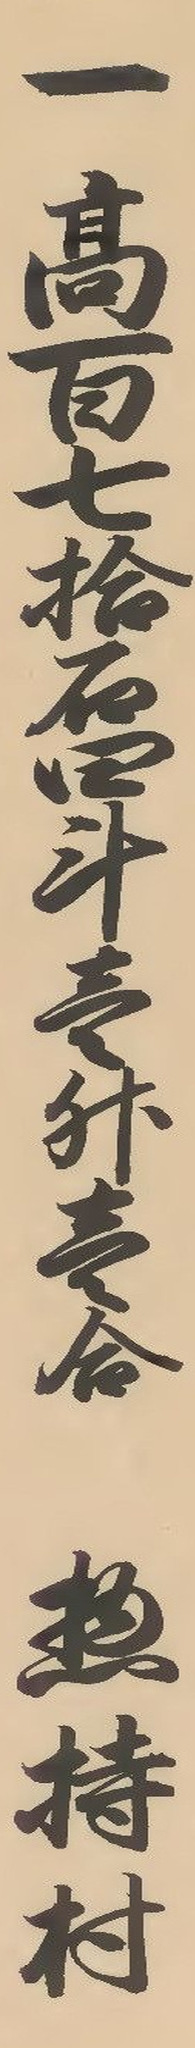一高百七拾石四斗壱升壱合惣持村
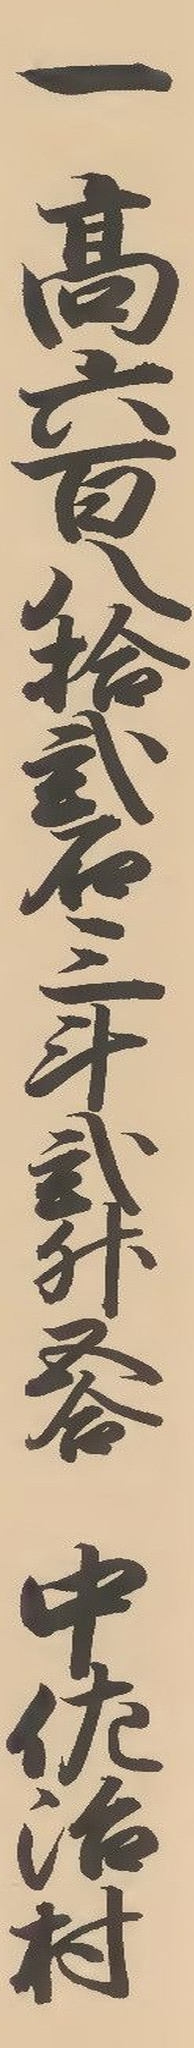一高六百八拾弐石三斗弐升五合中佐治村
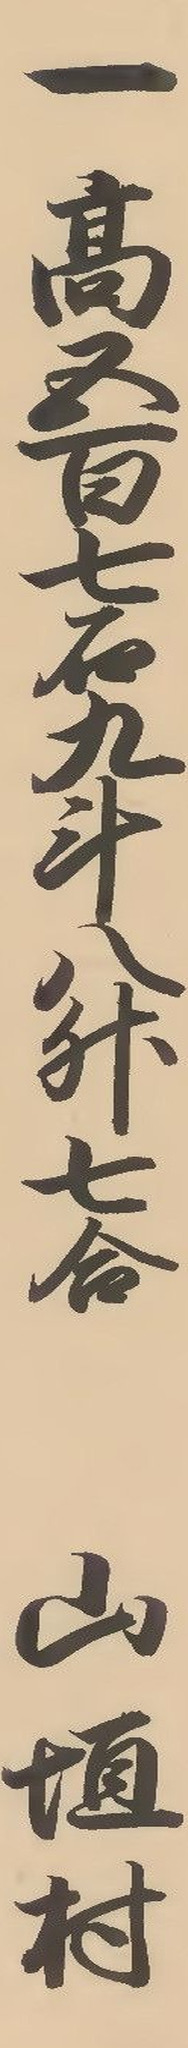一高五百七石九斗八升七合山垣村
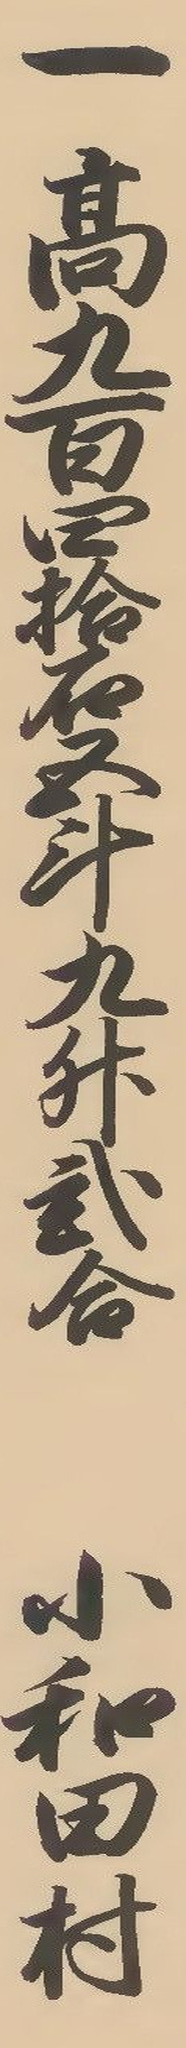一高九百四拾石五斗九升弐合小和田村

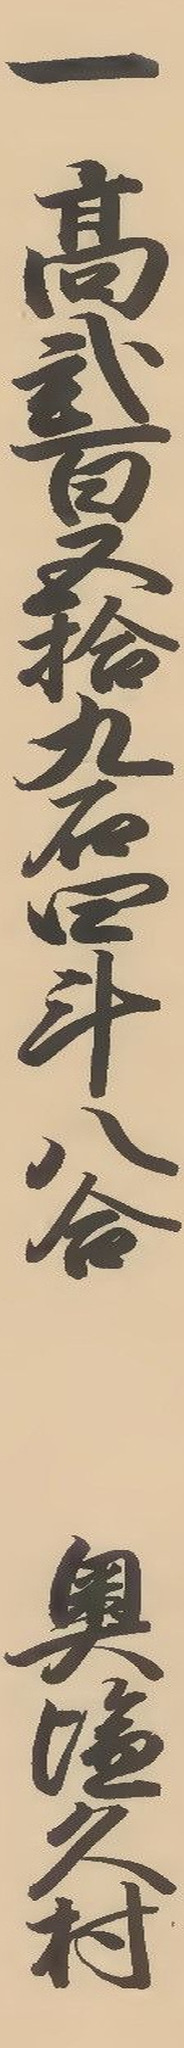一高弐百五拾九石四斗八合奥塩久村
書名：丹波国郷帳
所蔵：国立公文書館 National Archives of Japan
